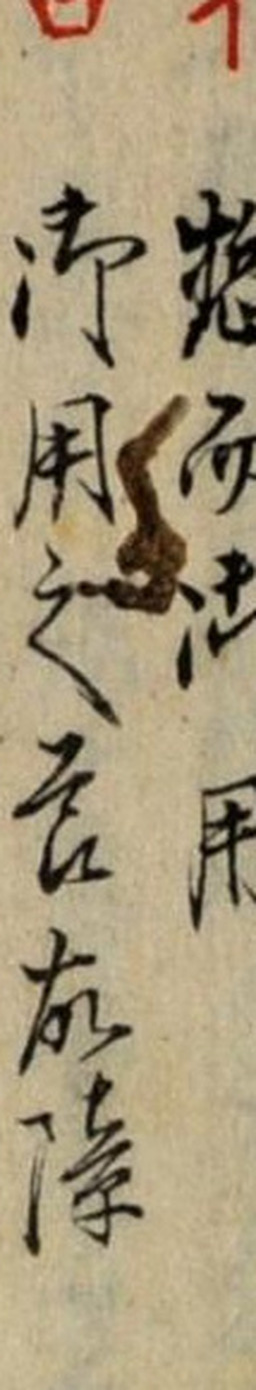ロ御用の節故障
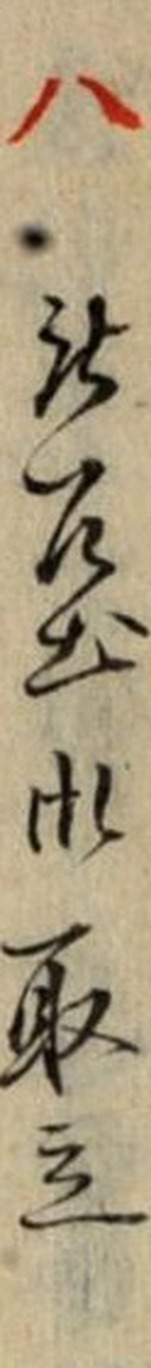ハ被召出御取立
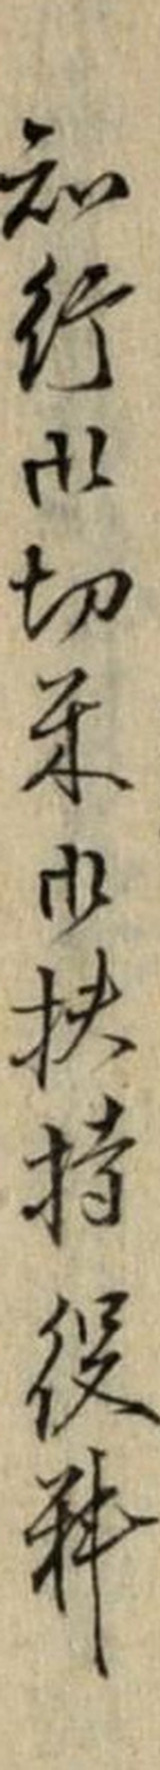ニ知行御切米御扶持役料
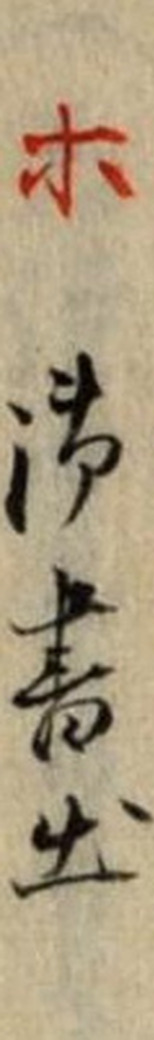ホ御書出
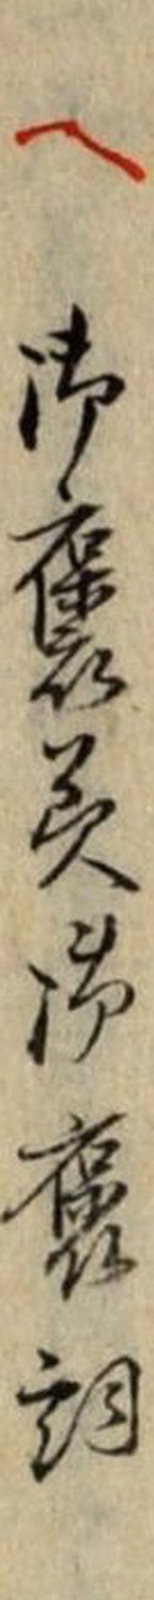ヘ御褒美御褒詞
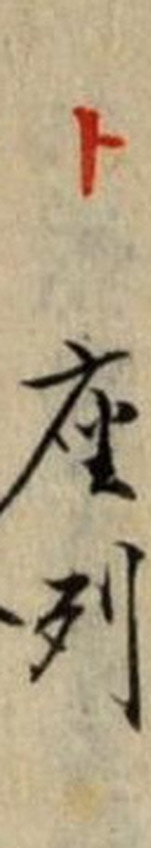ト座列
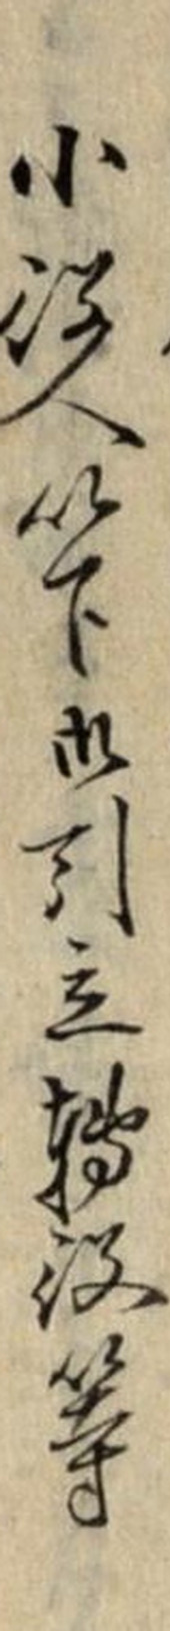ヌ小役人以下御引立転役等
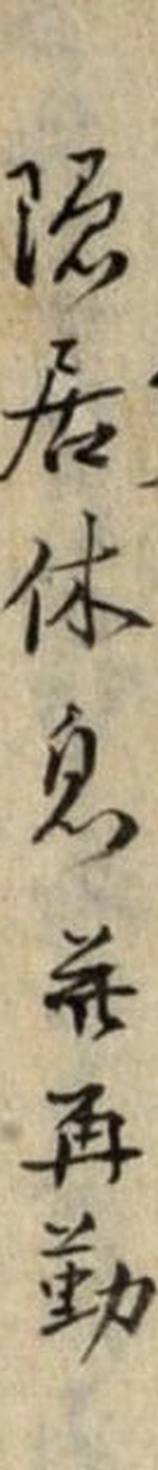ル隠居休息並再勤
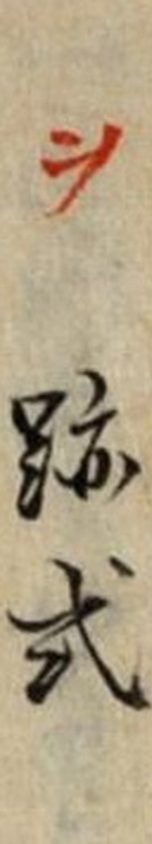ヲ跡式
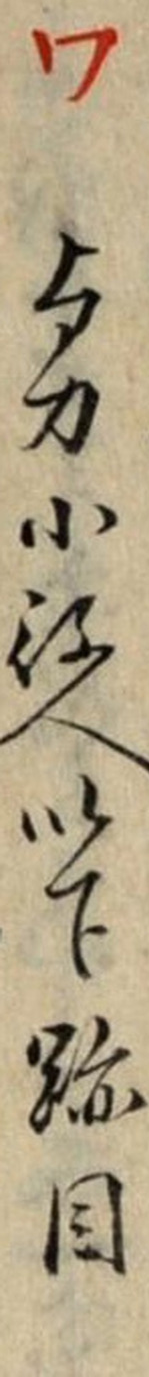ワ与力小役人以下跡目
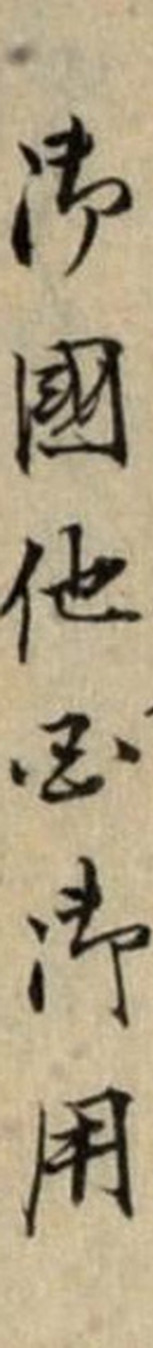カ御國他国御用
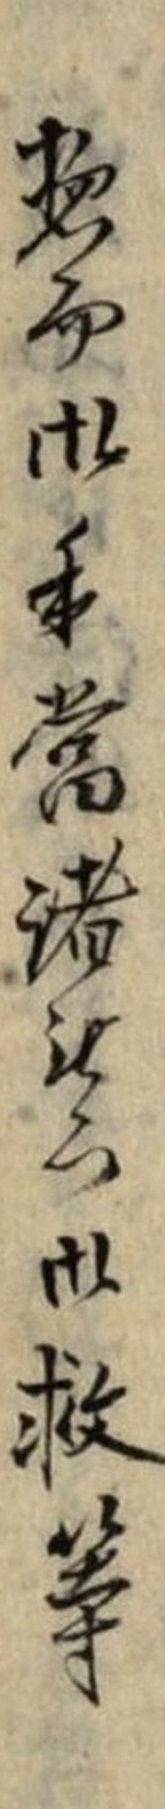ヨ惣て御手当諸被下御救等

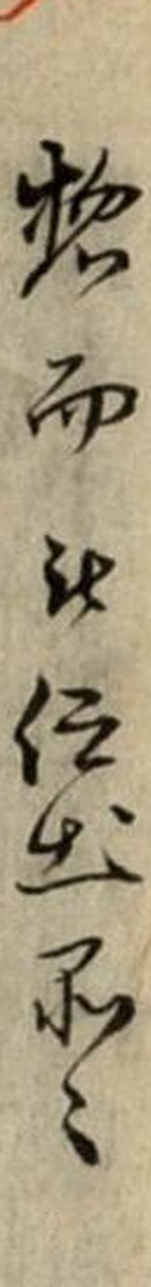タ惣て被仰出品々
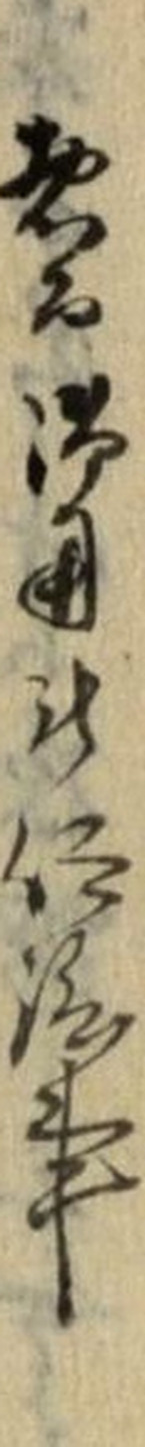惣て御用被仰渡事
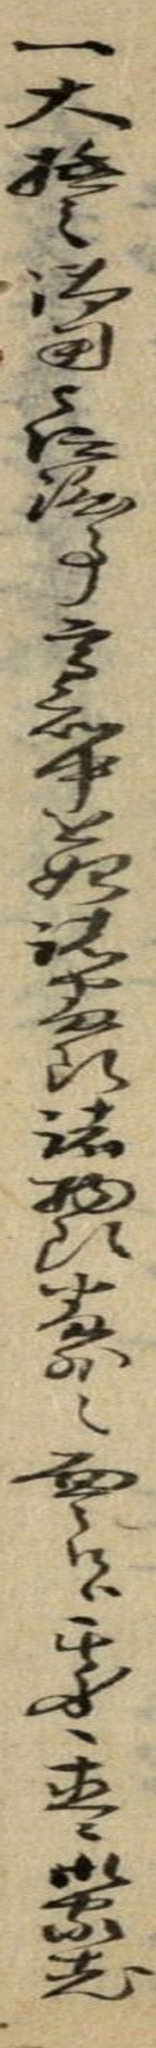一大抵の御用被仰渡事高知中を始諸番頭諸物頭番外の面々えは其身へ直に御家老
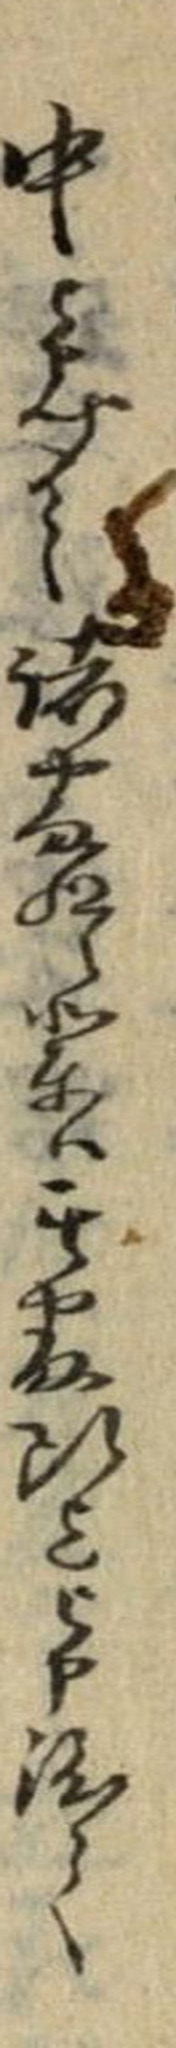中被申聞之諸番組之輩は其番頭迄被申渡之
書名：御用并被仰出之部
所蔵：福井県文書館 Fukui Prefectural Archives
